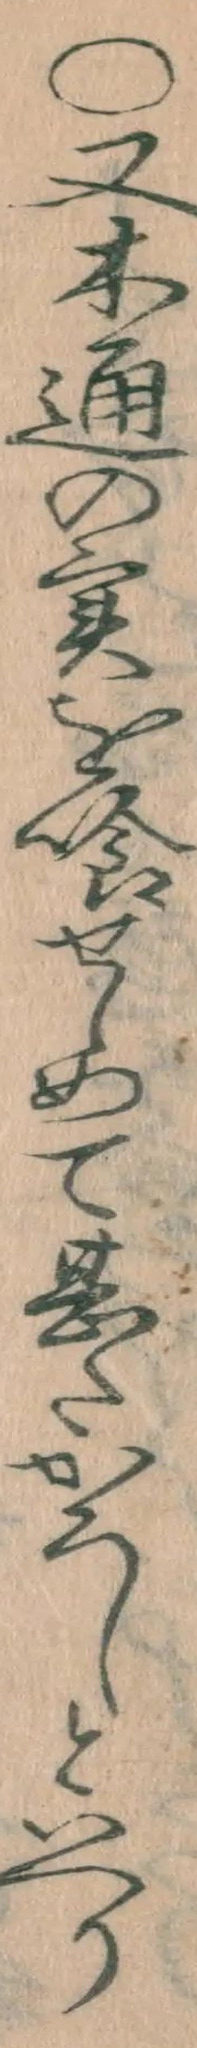○又木通の実を喰せしめて甚たかろしといへり
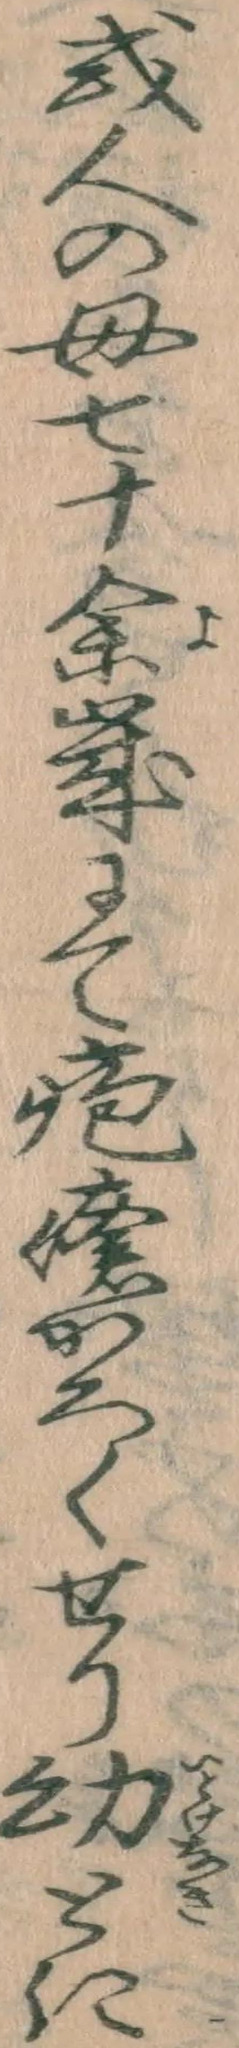或人の母七十余歳にて疱瘡かろくせり幼とき
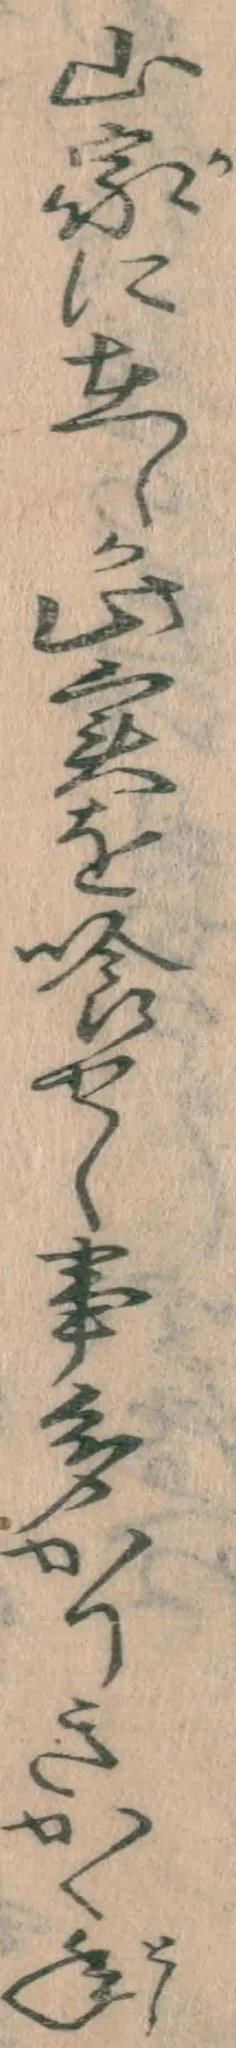山家に在しか此実を喰せし事多かりきかく年
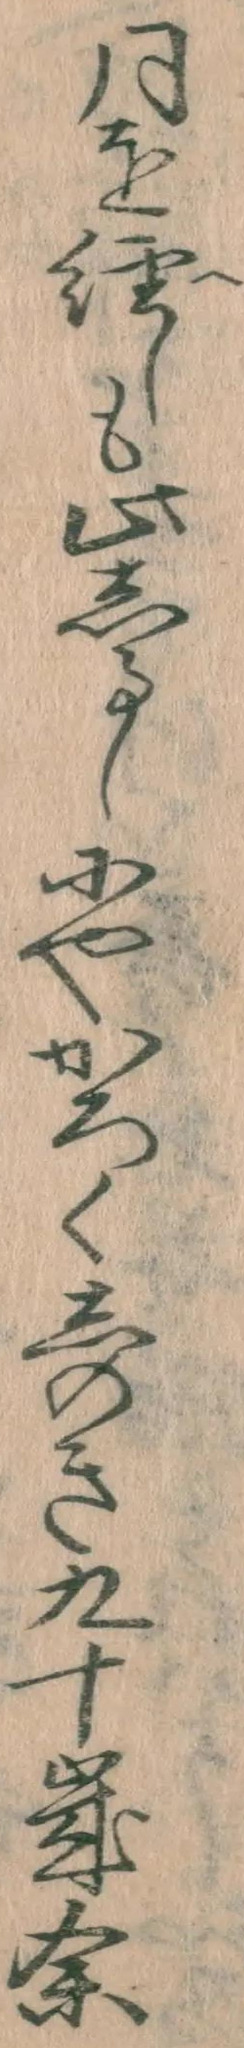月を経しも此しるしにやかろくしのき九十歳余
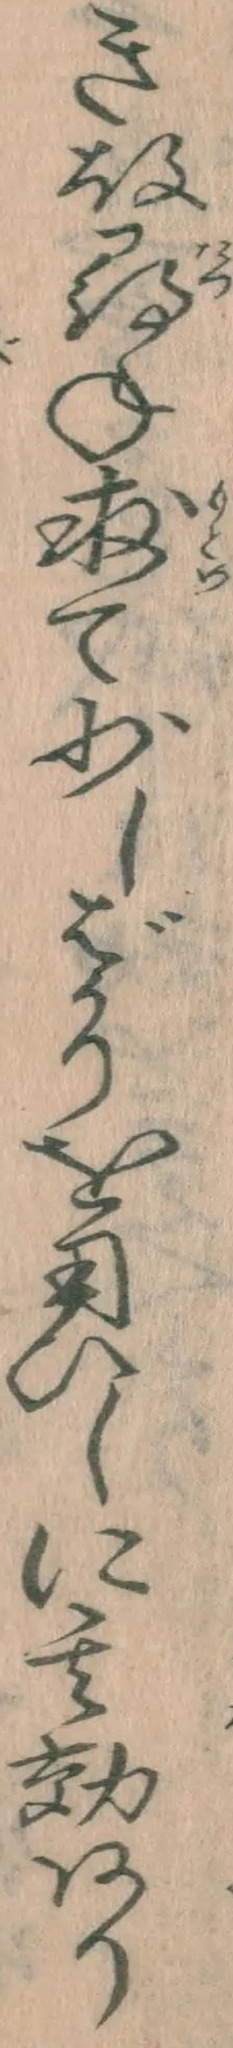き故尋ね求て少しばかりを用ひしに其効あり
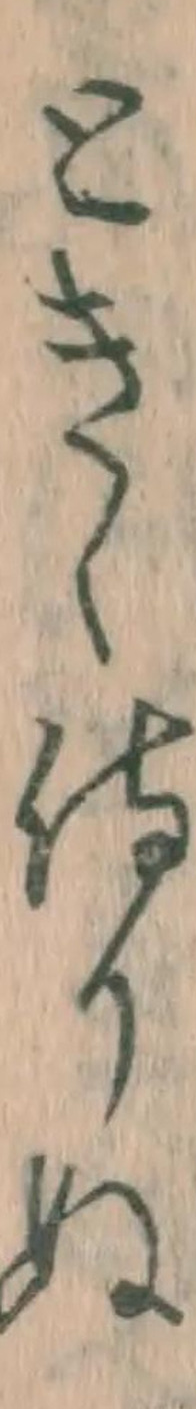ときゝ侍りぬ
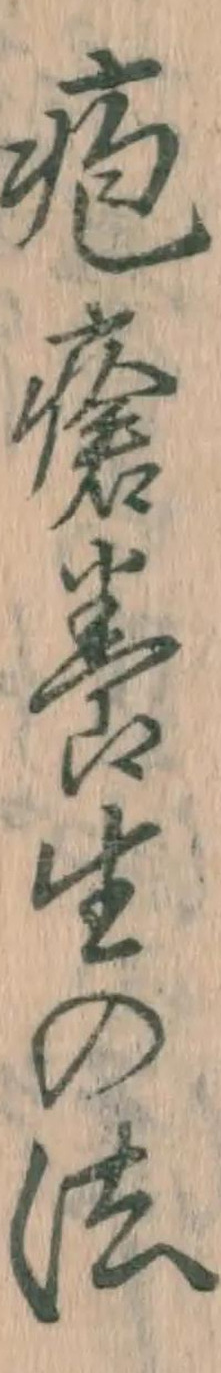疱瘡養生の法
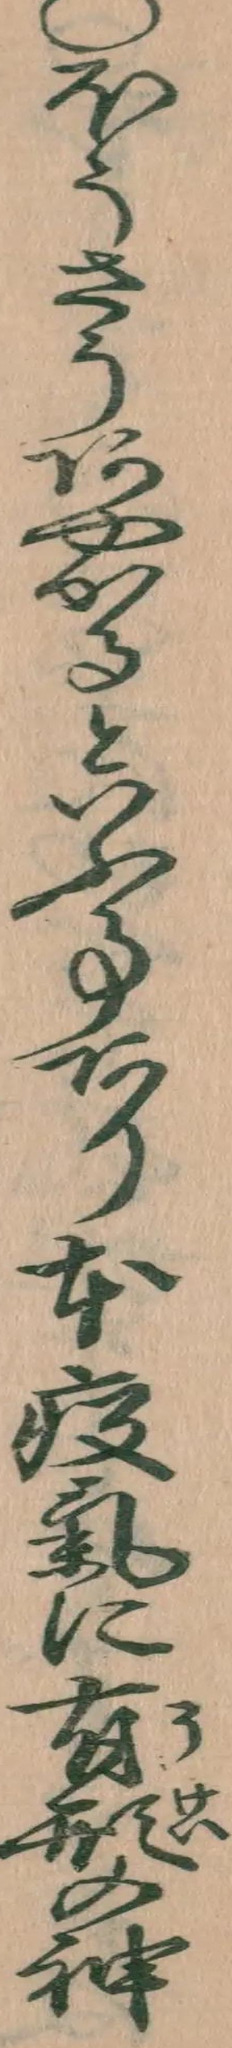○ほうさうあやかるといふ事あり本疫気に有形の神
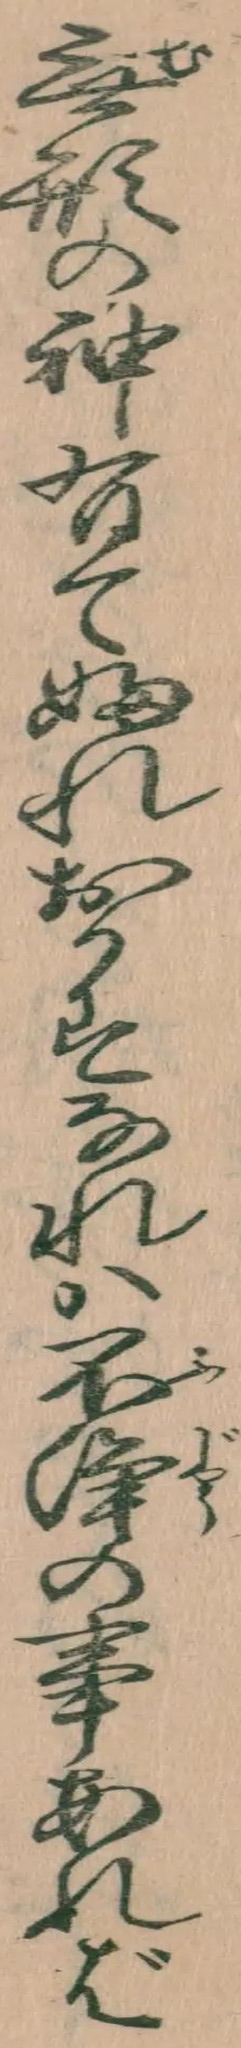無形の神有てふれおかすなれは不浄の事あれば
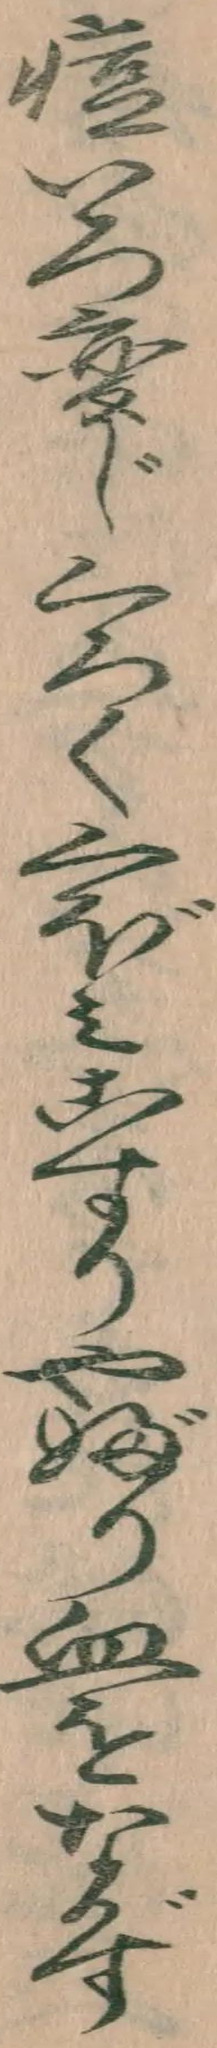痘いろ変じくろくくぼみこすりやぶり血をながす
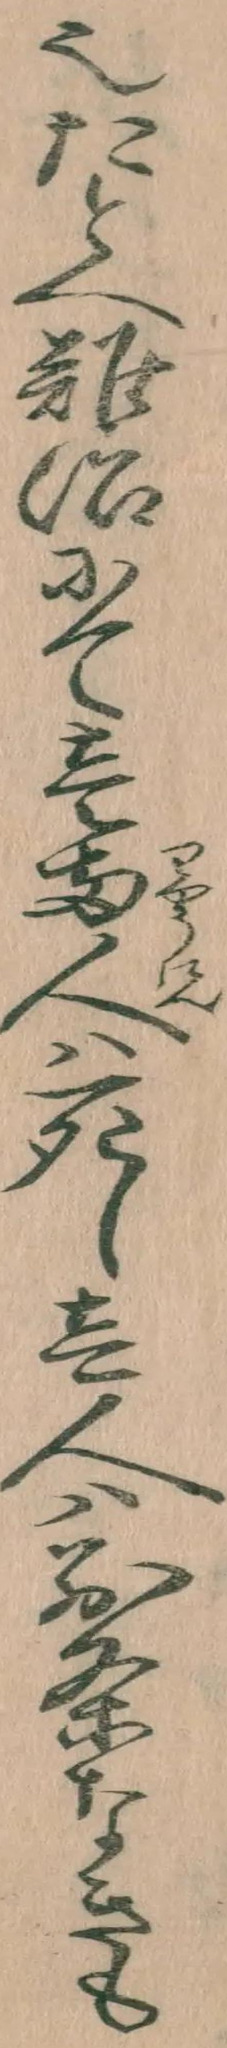也たとへ難治にて壱両人は死し壱人は別条なきも
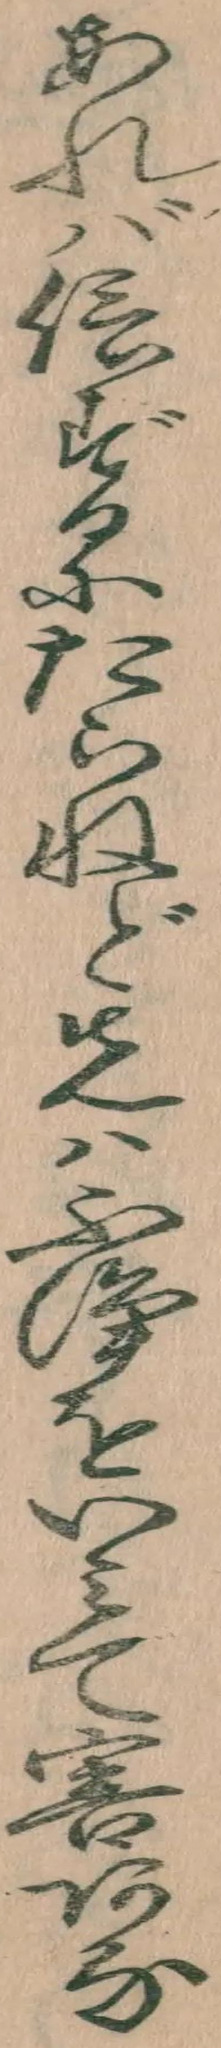あれば信ずるにたらねど先は不浄をいみて害ある
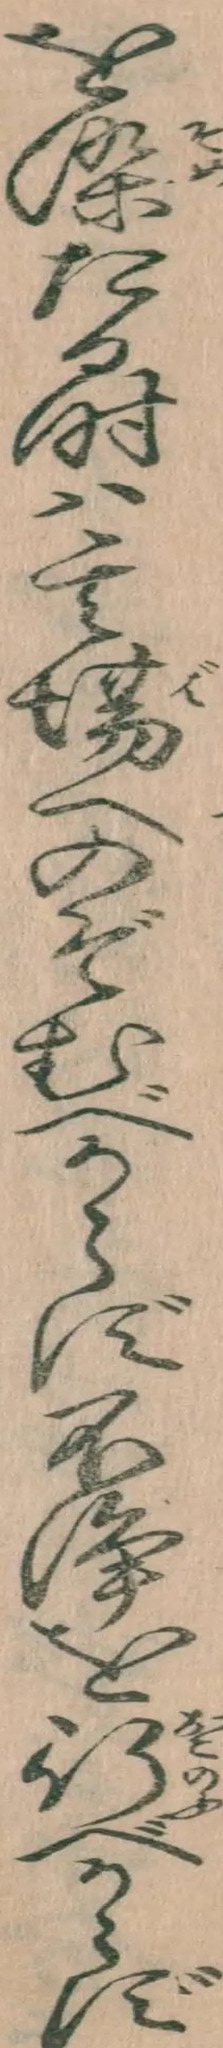を染たる時は其場へのぞむべからず不浄を行べからず
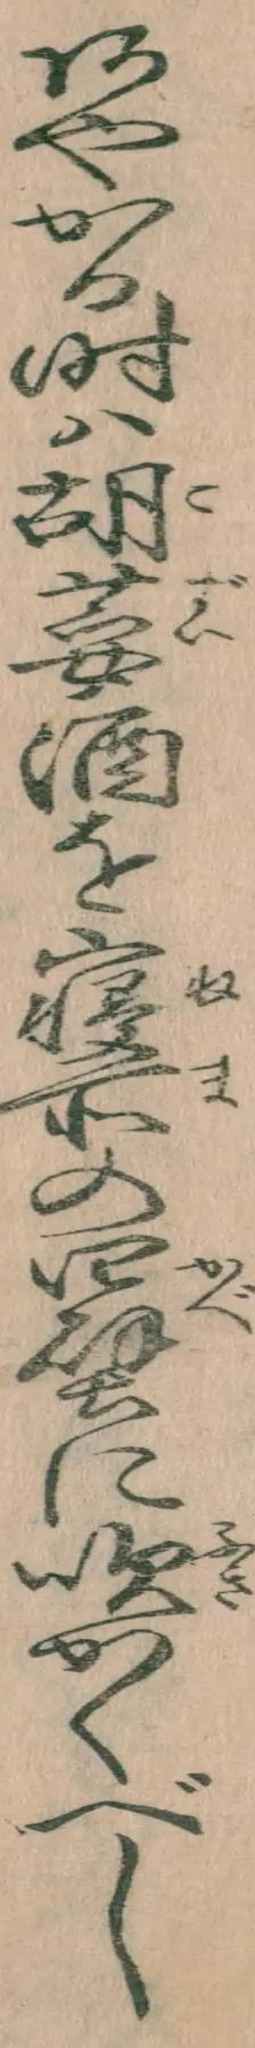あやかる時は胡荽酒を寝所の四壁に吹かくべし
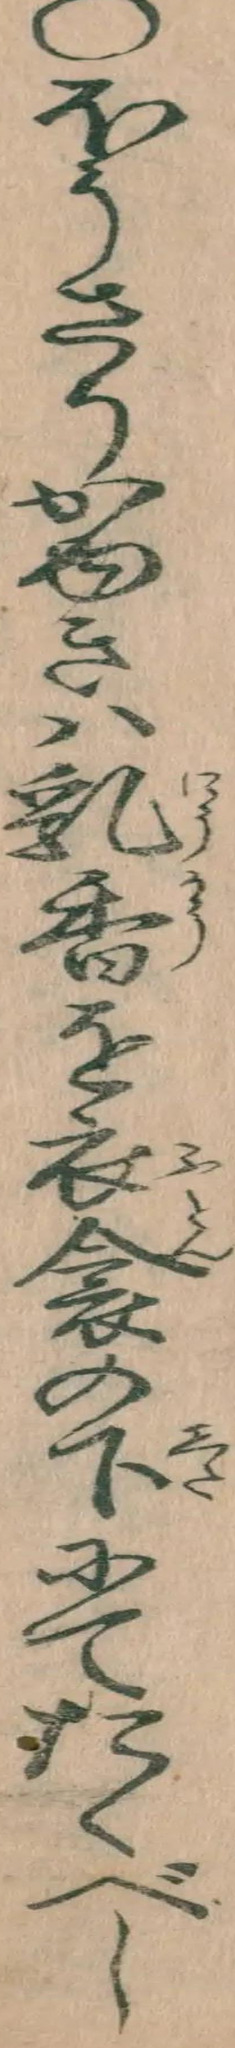○ほうさうかゆきは乳香を衣衾の下にてたくべし

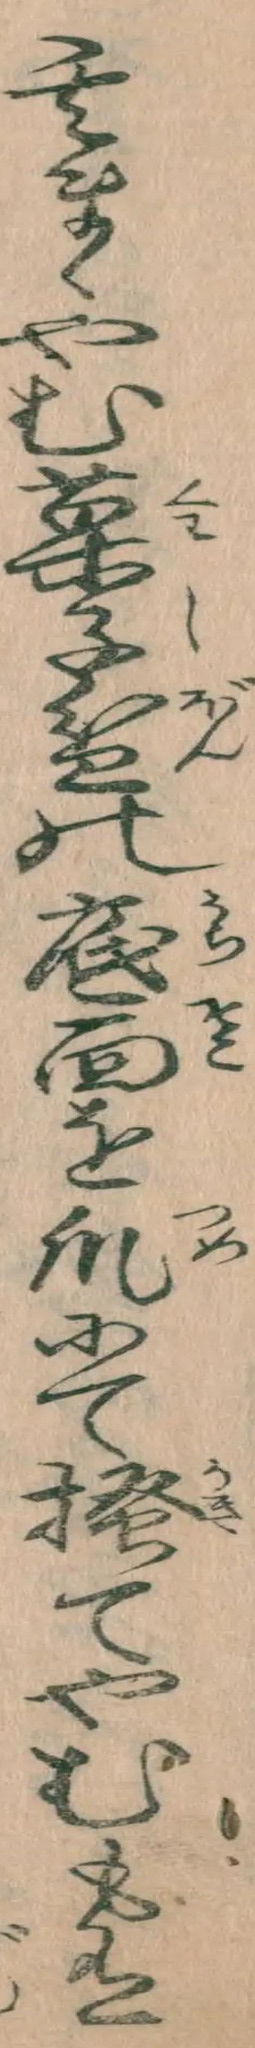其まゝやむ菓子盆の底面を爪にて掻てやむも有
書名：痘家初心問答
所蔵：国立国会図書館 National Diet Library, JAPAN
